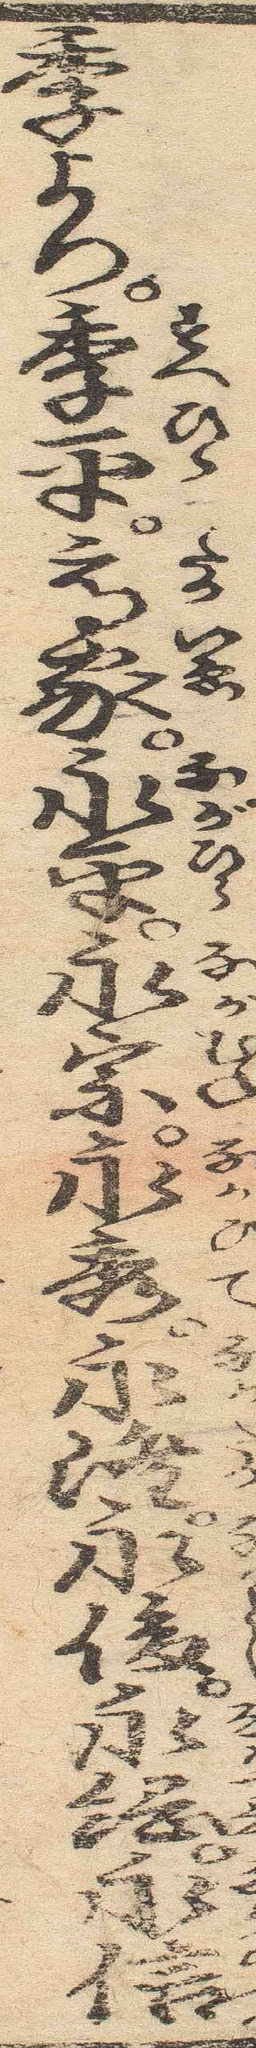季より。季平。髙家。永平。永宗。永秀。永隆。永俊。永綱。永信。
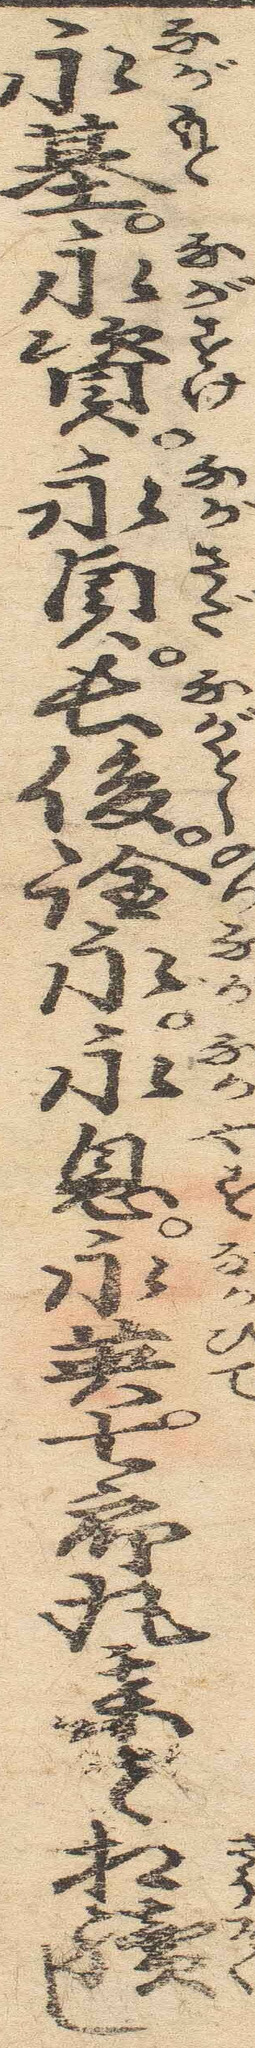永基。永資。永貞。長俊。倫永。永息。永英。七郎丸参て相続なし
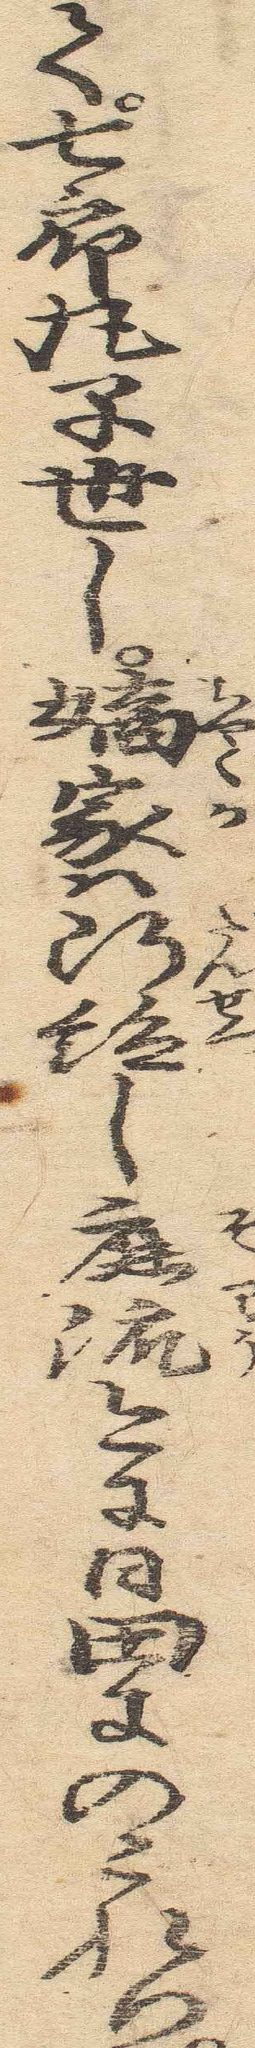て。七郎丸早世し。摘家は断絶し鹿流今に日田にのこれり。
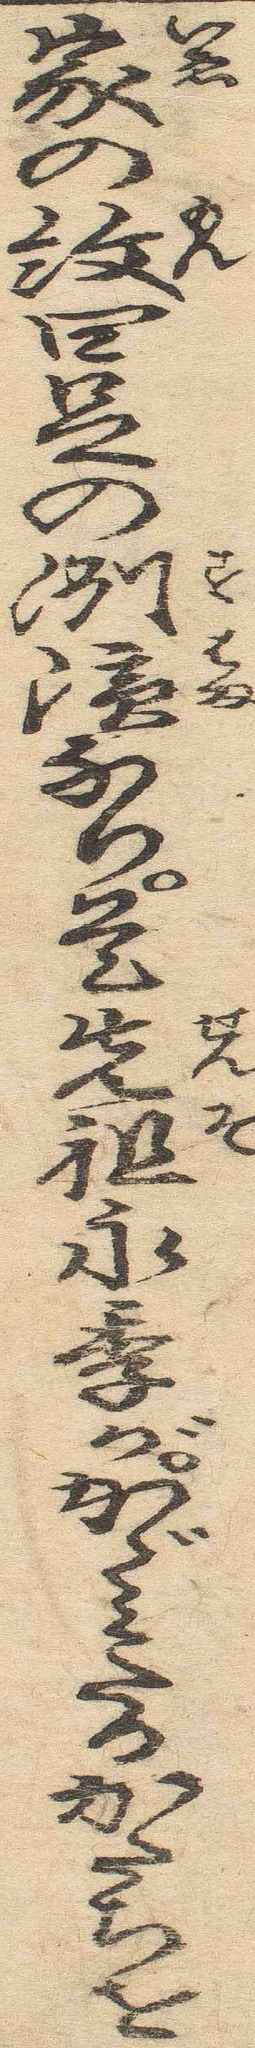家の紋四足の州浜なり。是先祖永季が。かゞみたるかたちを
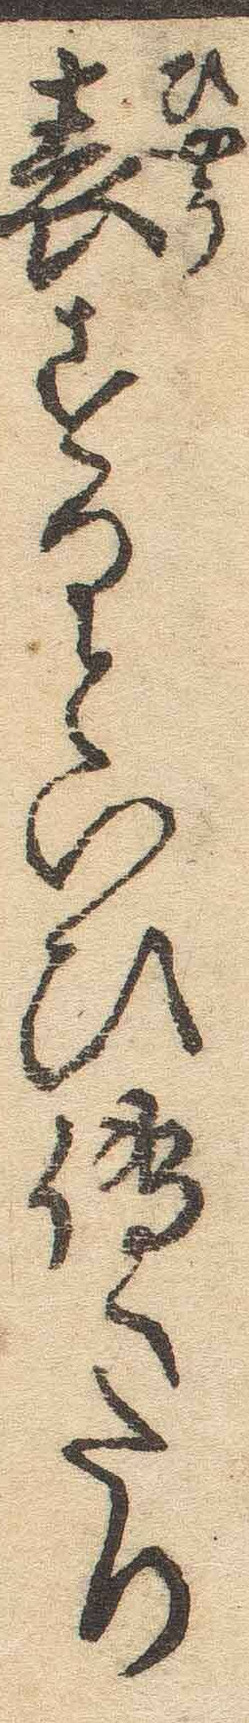表するといひ伝へたり
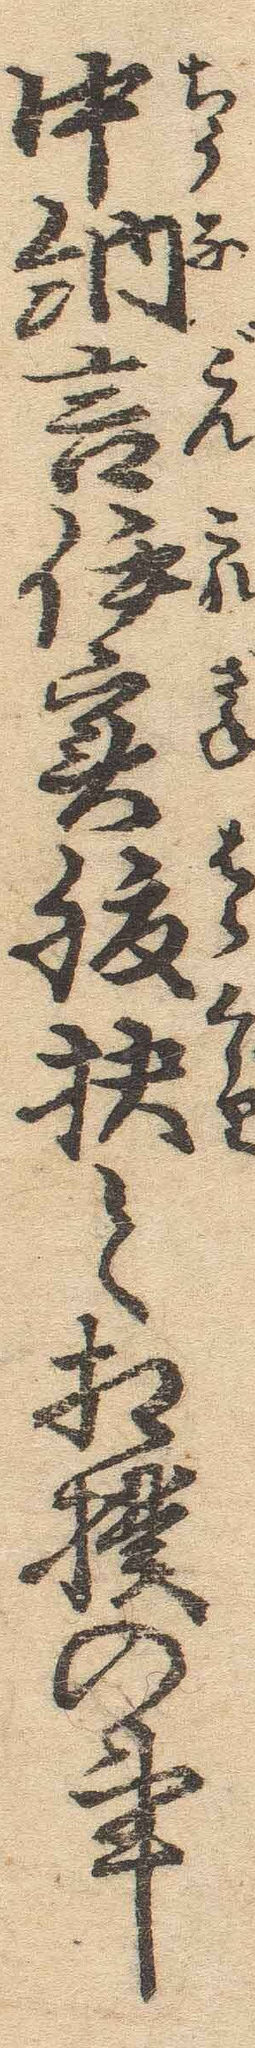中納言伊実腹抉と相撲の事
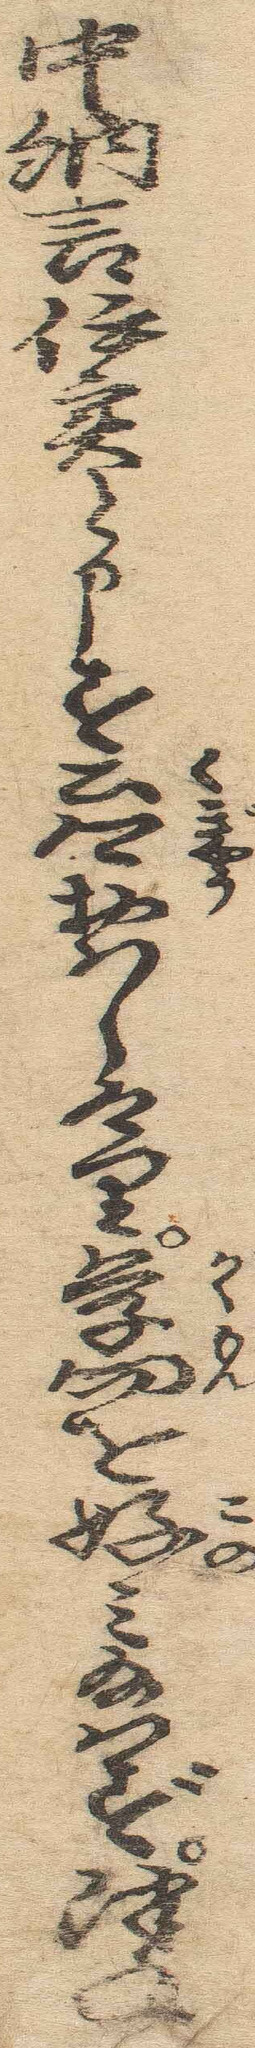中納言伊実と申す公卿おはしけり。学問を好み給はず。つねに
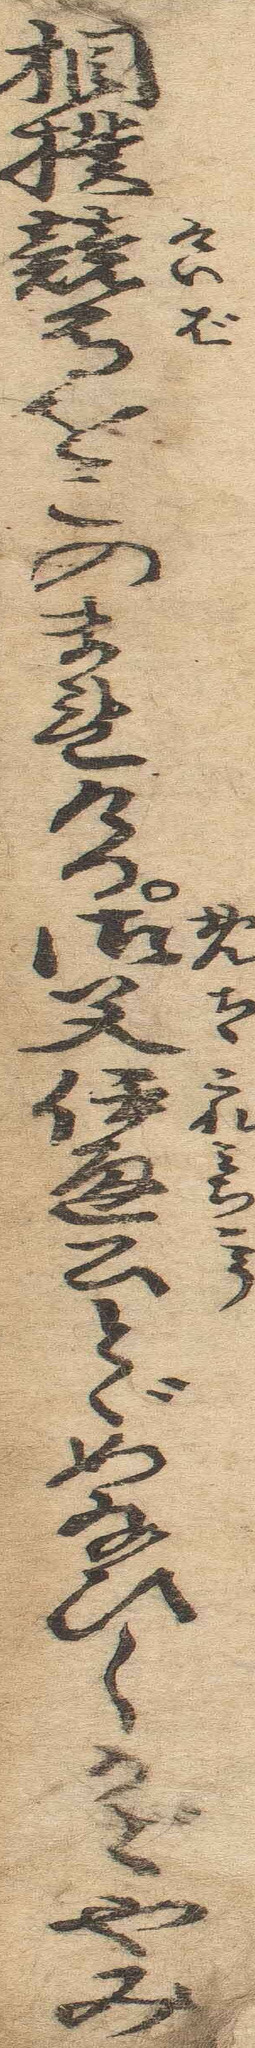相撲競馬をこのまれけり。御父伊通公とゞめ給ひしかどやみ

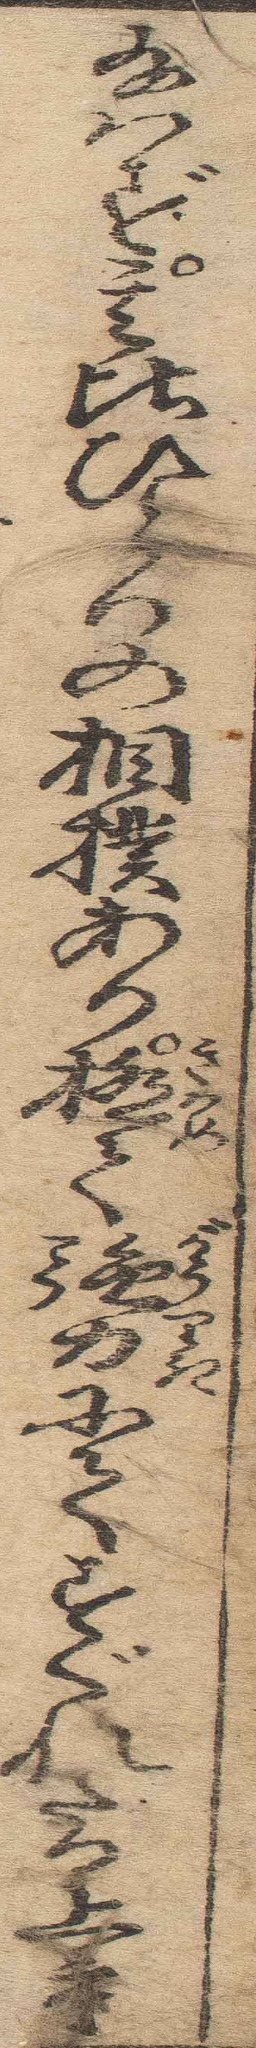給はず。其比ひとりの相撲あり。極て強力にてすぐれたる上手
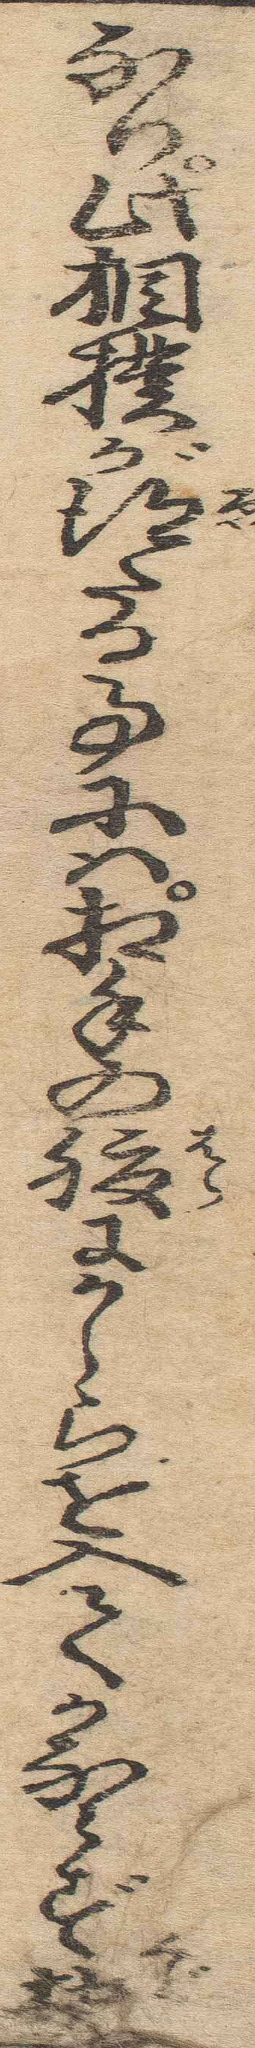なり。此相撲が得たるには。相手の腹にかしらを入てかならず袂
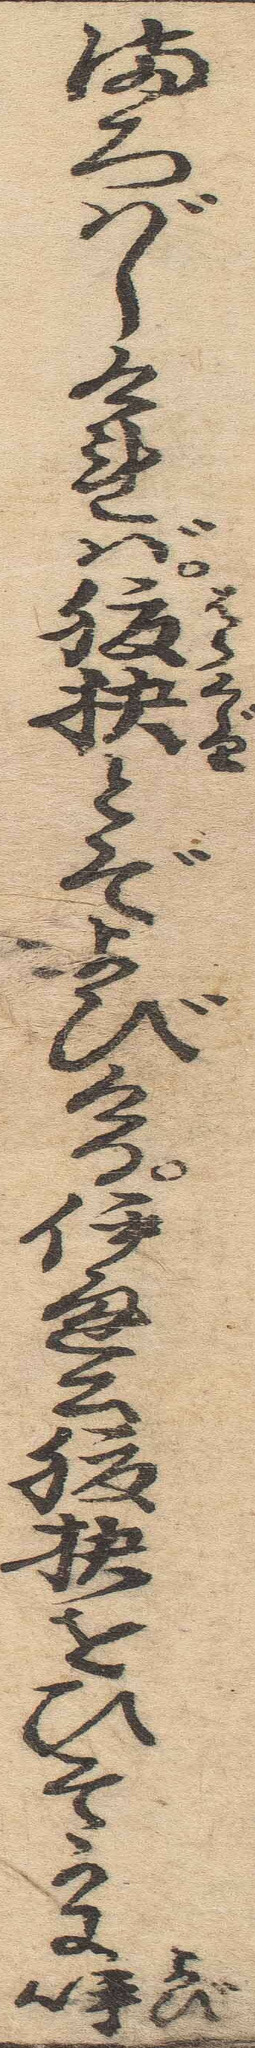まろがしければ。腹袂とぞよびけり。伊通公腹袂をひそかに呼
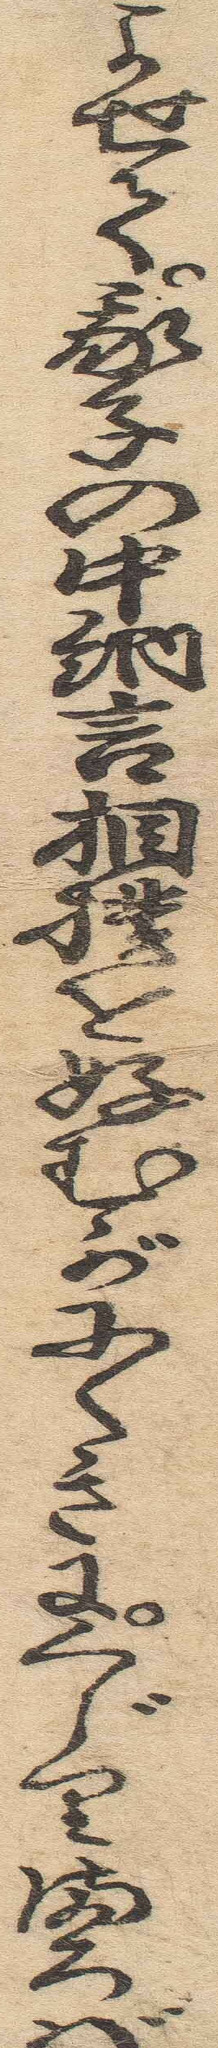よせて。我子の中納言相撲をこのむがにくきに。くじりまろば
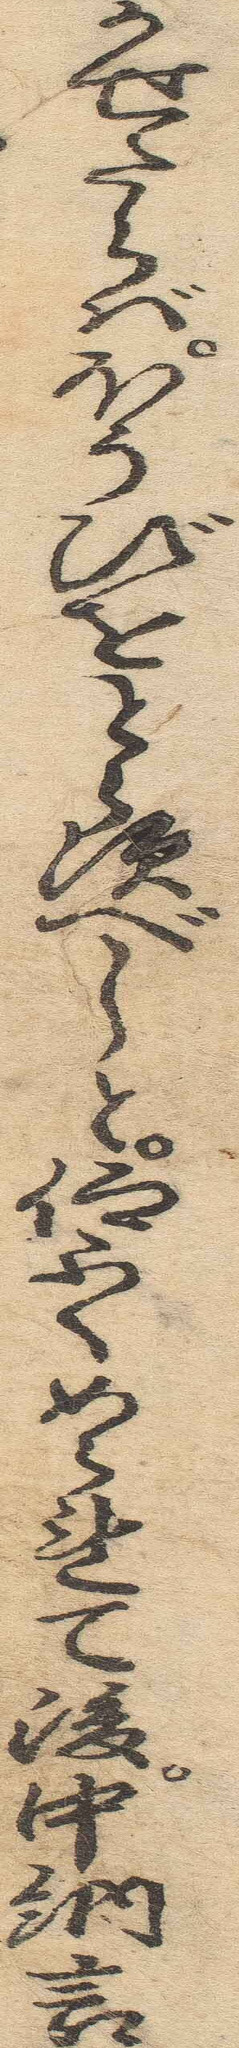かせたらば。ほうびをとらすべしと。仰ふくめられて後。中納言
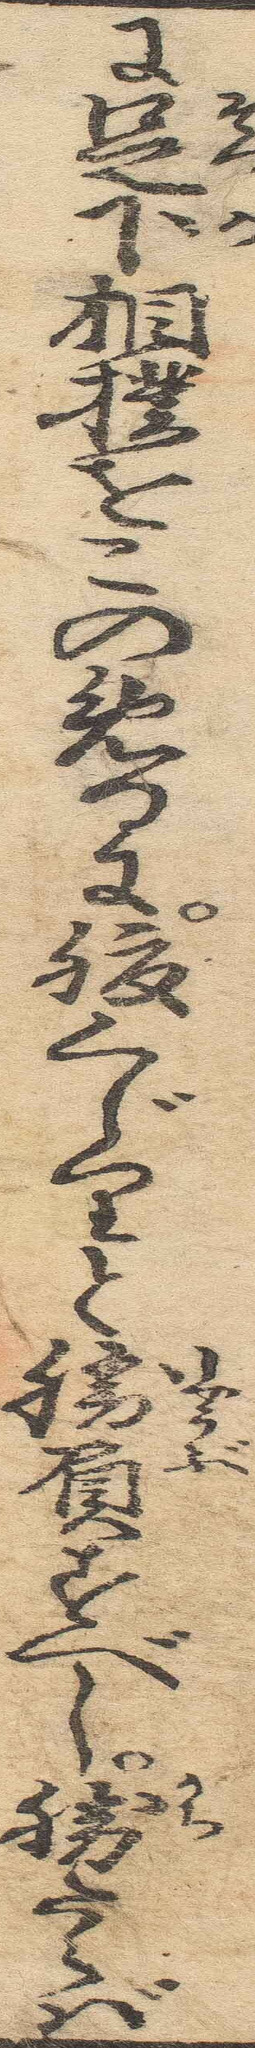に足下相撲をこのめるに。腹くじりと勝負すべし。勝たらば
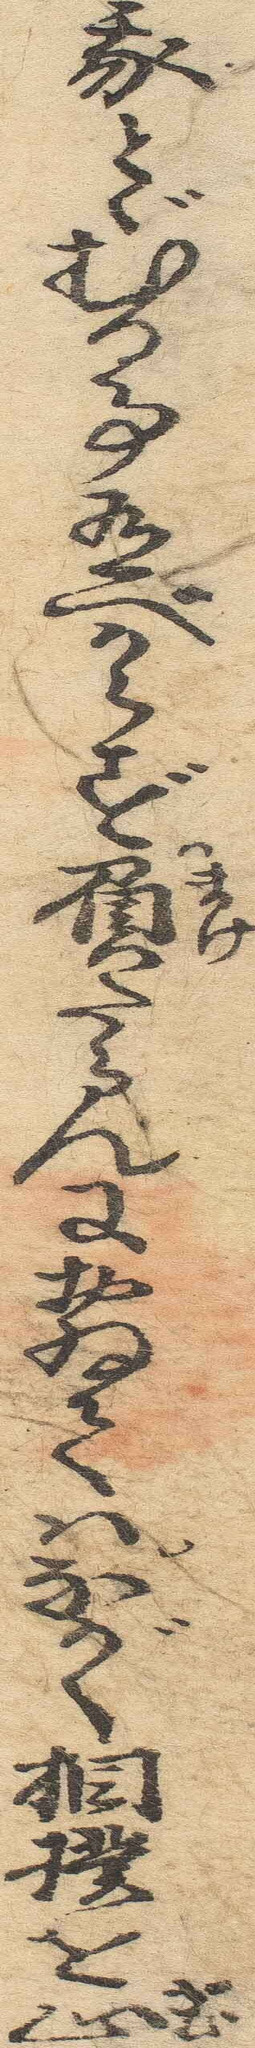我とゞむる事有べからず。負たらんにおゐては。ながく相撲を止
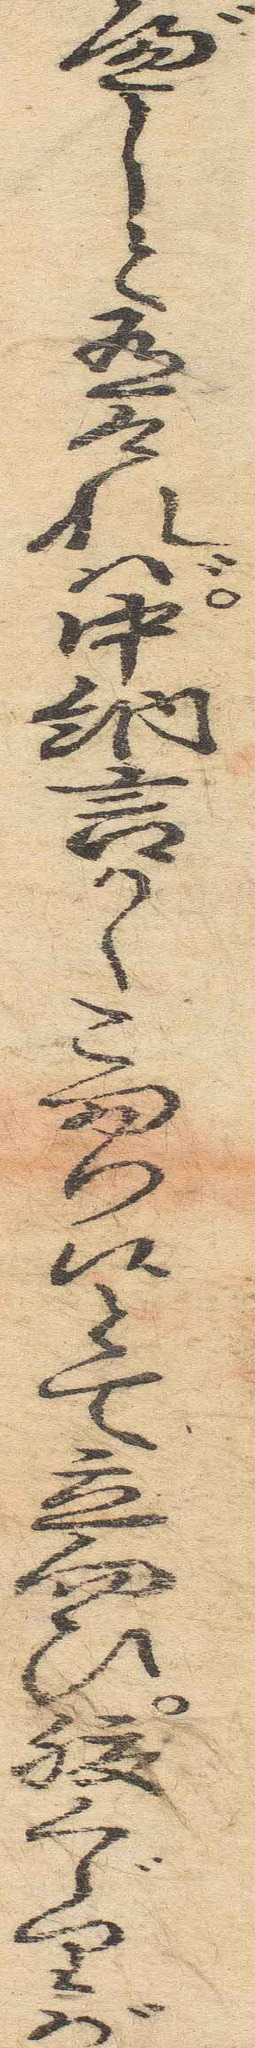べしと有ければ。中納言かしこまり候とて立向ひ。腹くじりが
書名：古今相撲大全
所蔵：東京学芸大学附属図書館 国文学研究資料館
